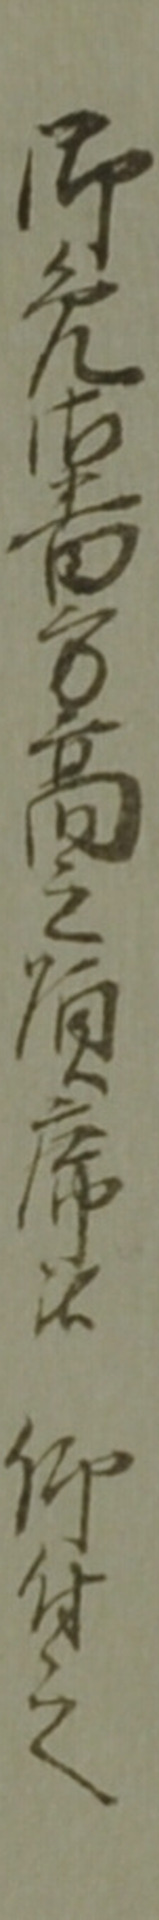御免御番方高之順席被仰付之
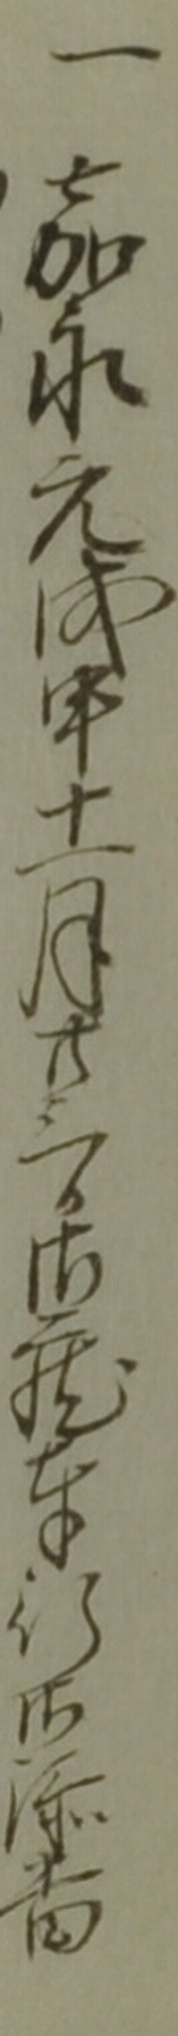一嘉永元戌申十一月廿三日御蔵奉行御添番
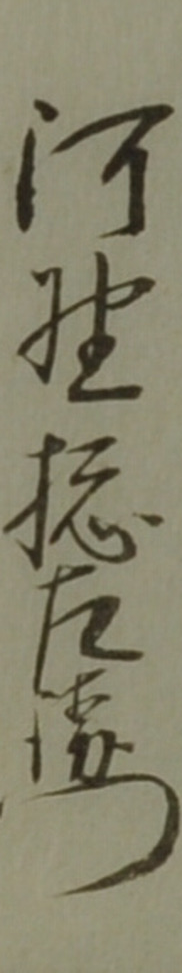河野捴左衛門
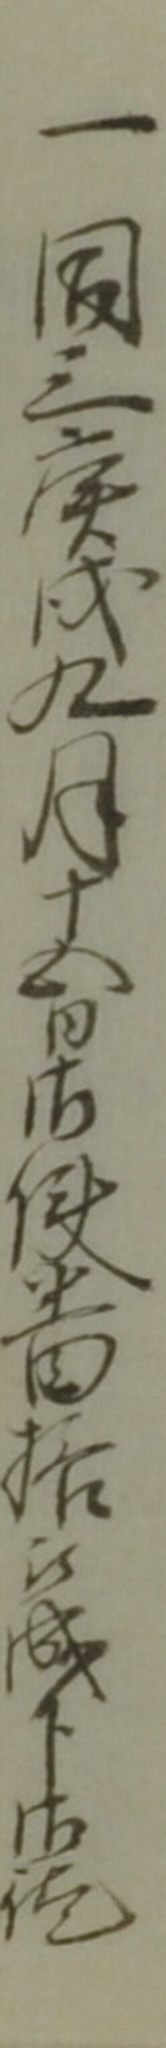一同三庚戌九月十五日御使番格被成下御徒
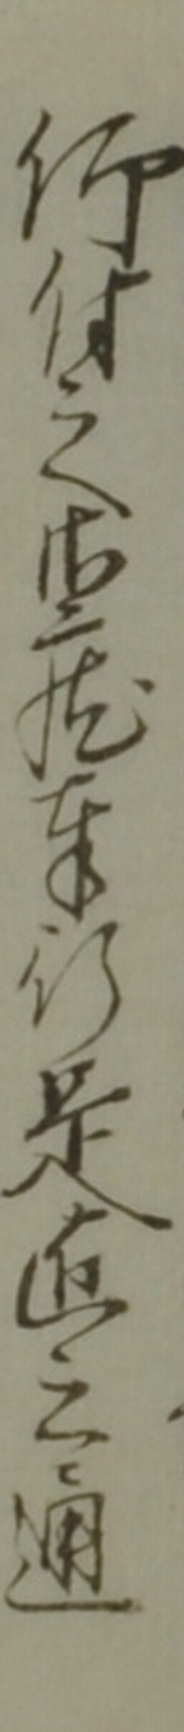仰付之御蔵奉行是迄之通
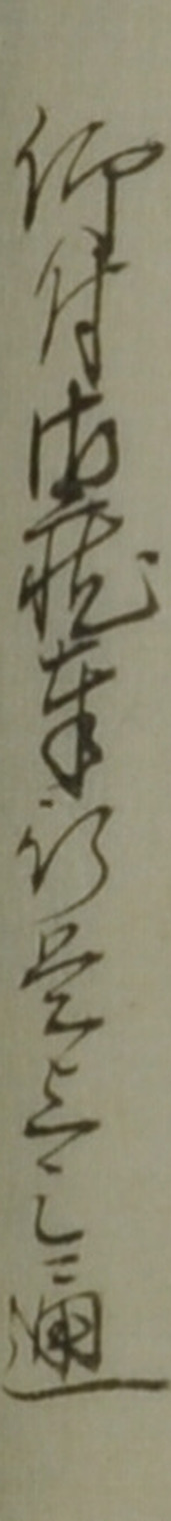仰付之御蔵奉行是迄之通
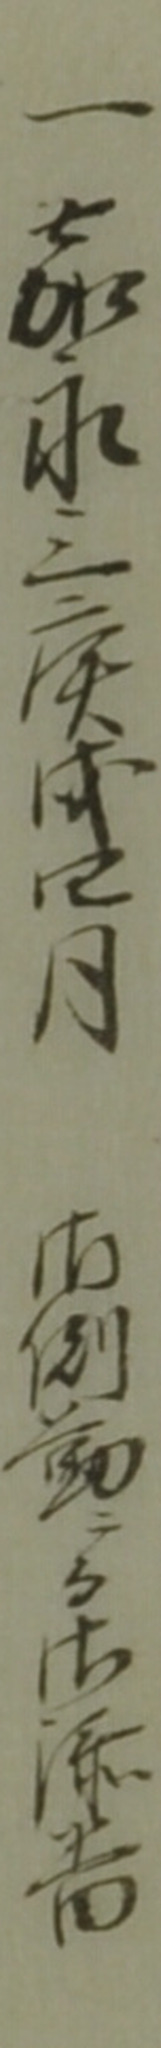一嘉永三庚戌四月御側勤にて御添番
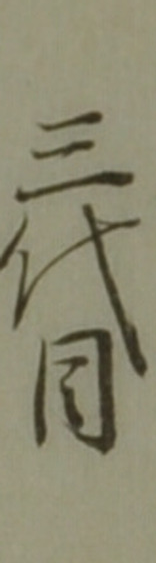三代目
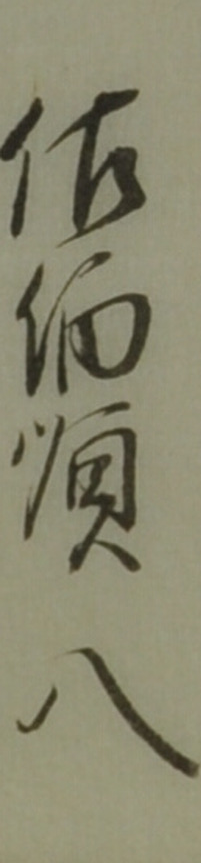佐伯順八
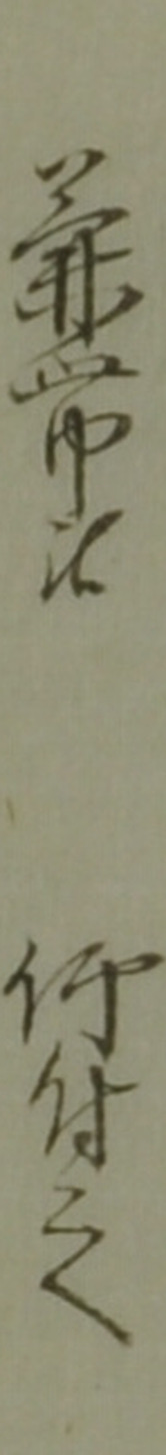兼帯被仰付之

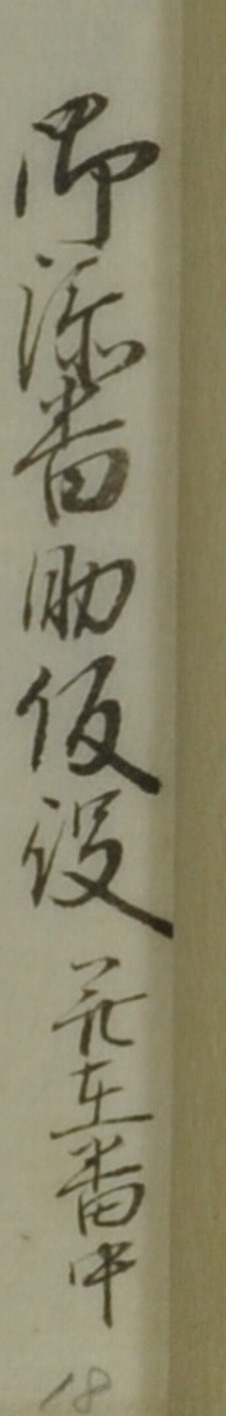御添番助仮役并在番中
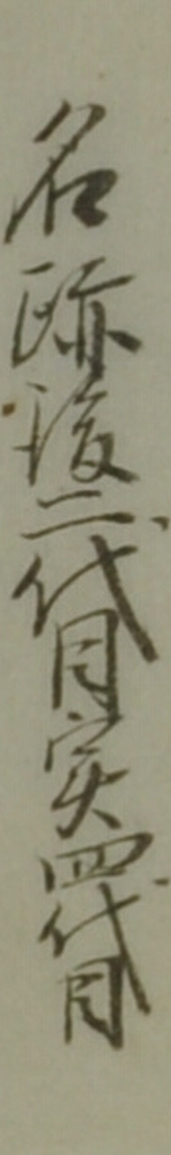名跡後二代目実四代目
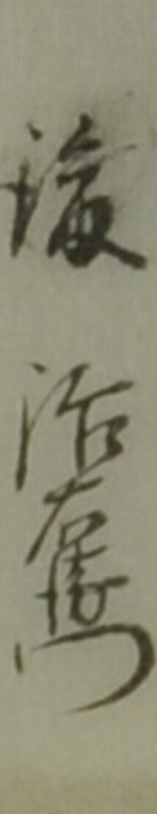後治右衛門
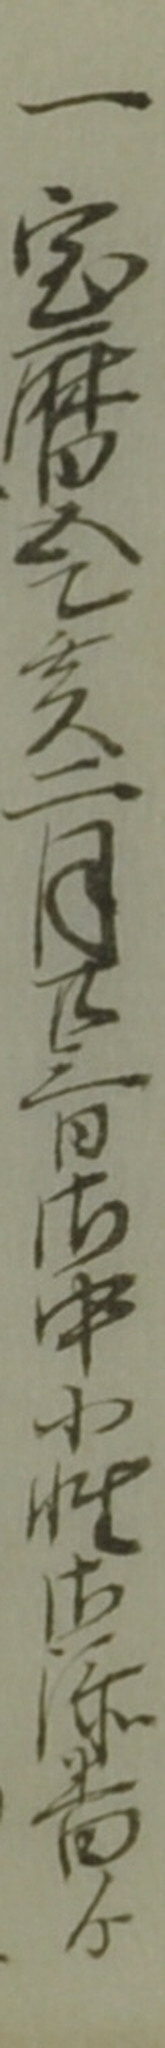一宝暦五乙亥二月廿三日御中小姓御添番より
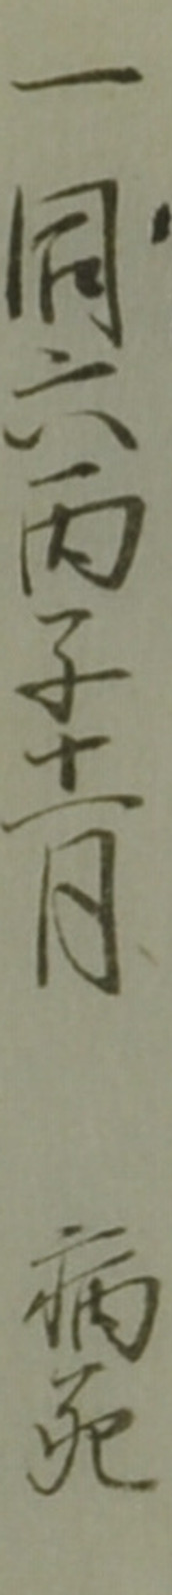一同六丙子十一月病死
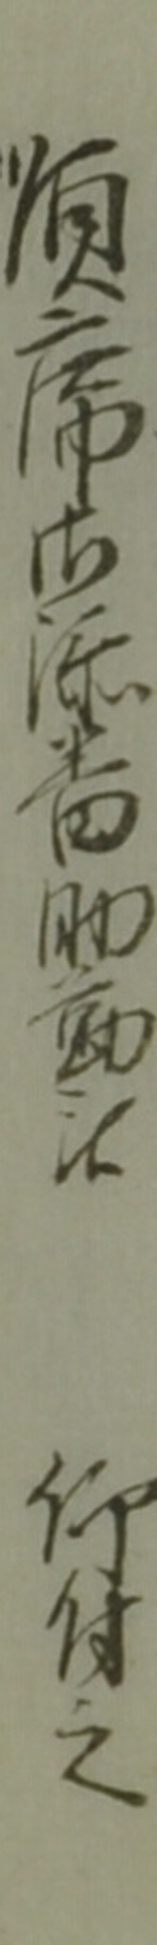順席御添番助勤被仰付之
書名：諸御役代々録（八）
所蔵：伊那市立高遠町図書館・合同会社AMANE
